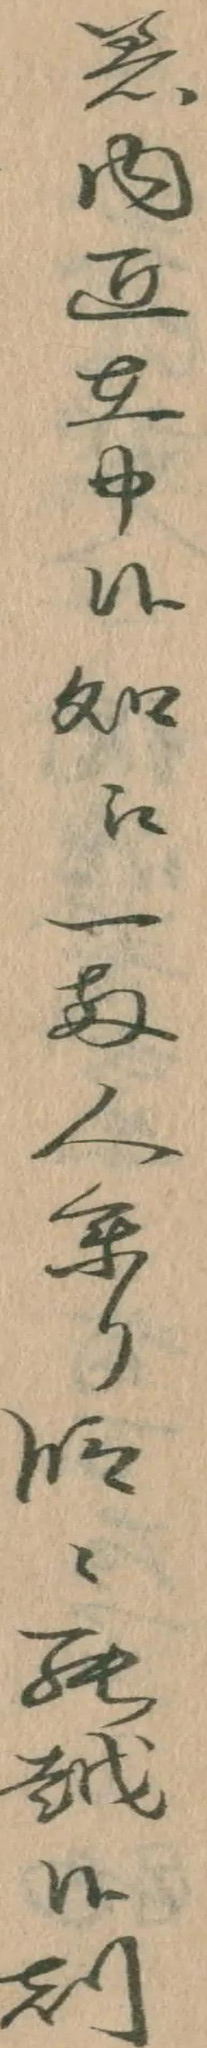着内匠在申候処江一両人参り段々罷越候刻
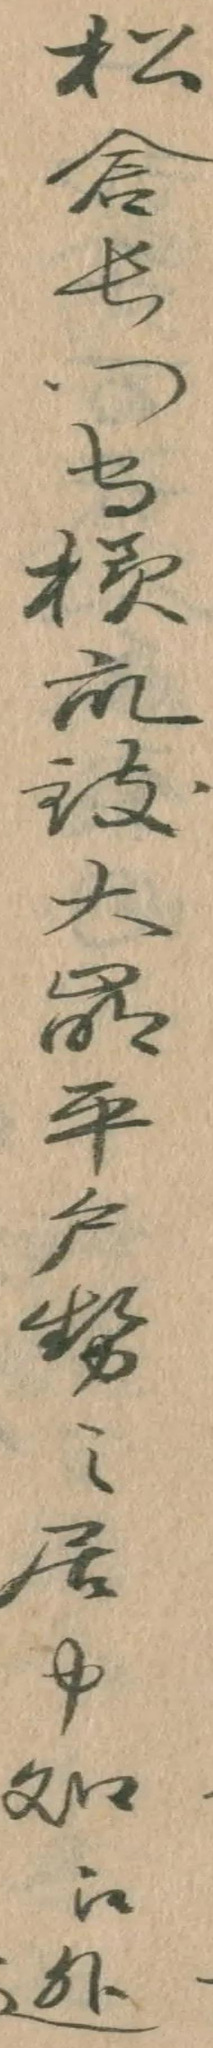松倉長門守様衆致大崩平戸勢之居申処江逃
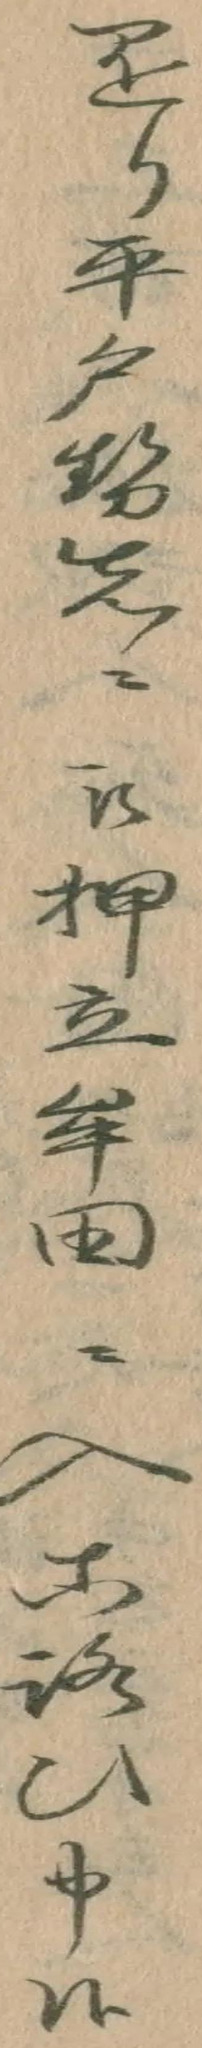懸り平戸勢先に被押立牟田に入古語ひ申候
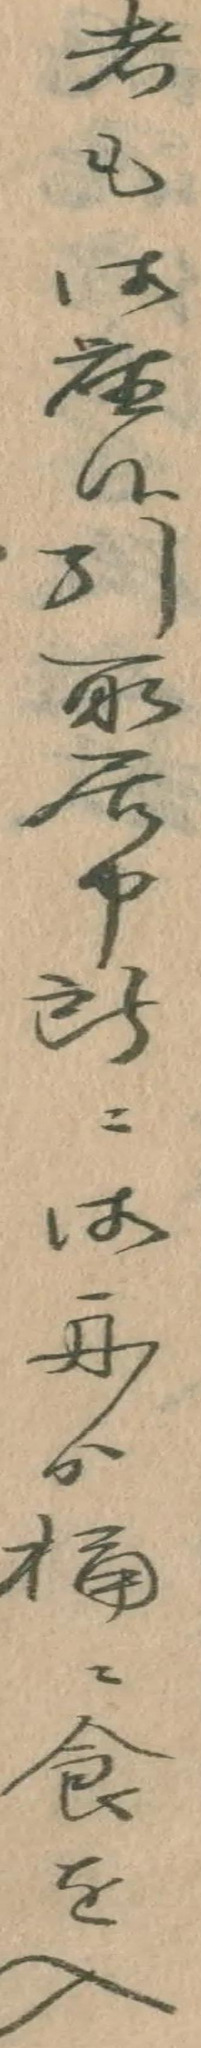者も御座候引取居申所に御舟ゟ桶に食を入
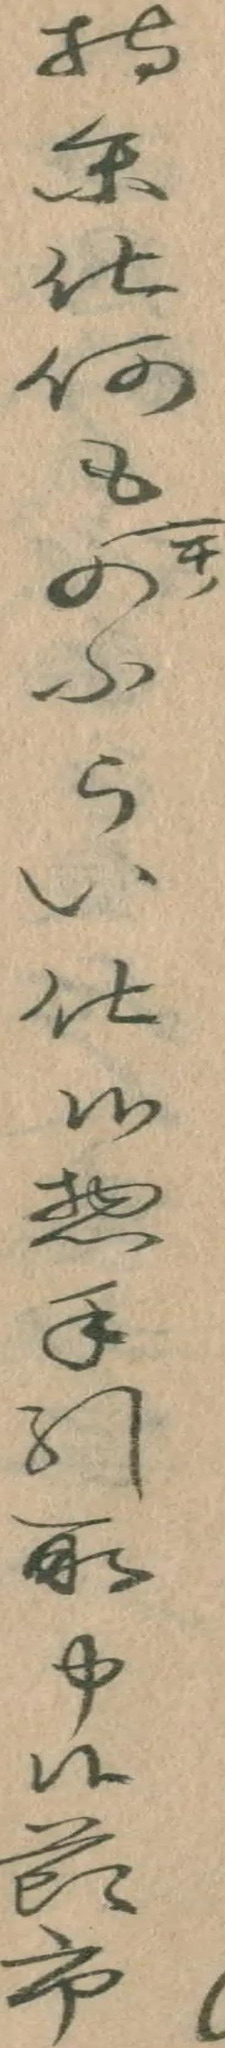持参仕何ものふらい仕候惣手引取申候節市
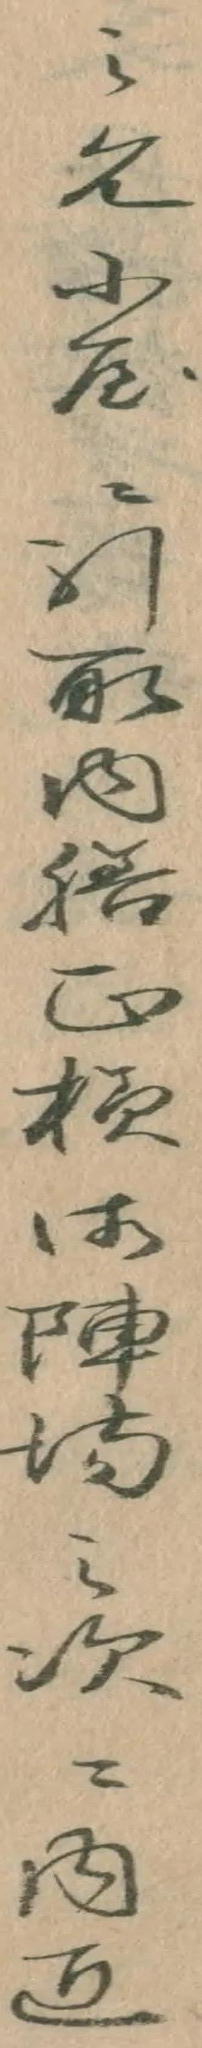之允小屋に引取内膳正様御陣場之次に内匠
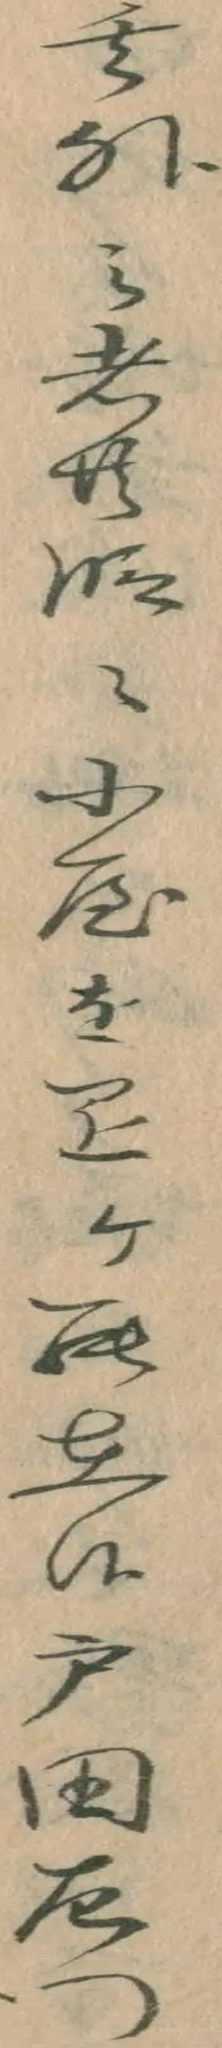其外之者共段々小屋を懸け罷在候戸田左門
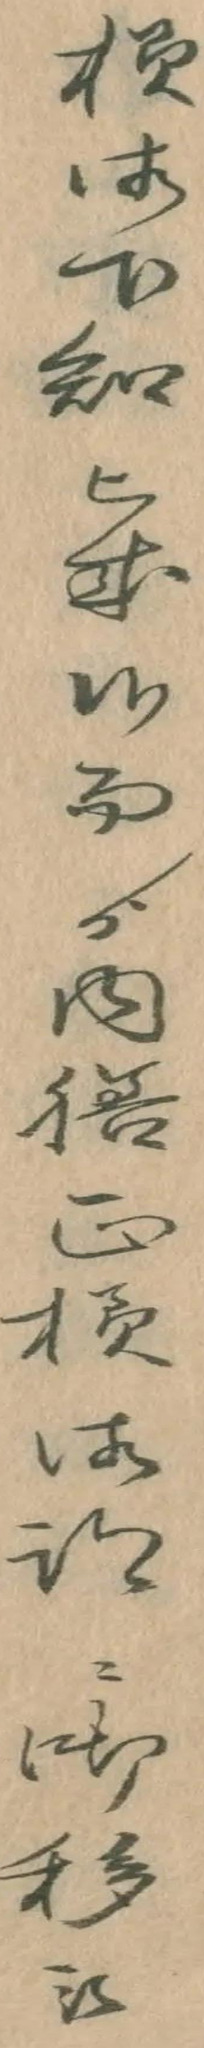様御下知被成候而ゟ内膳正様御跡に御移被

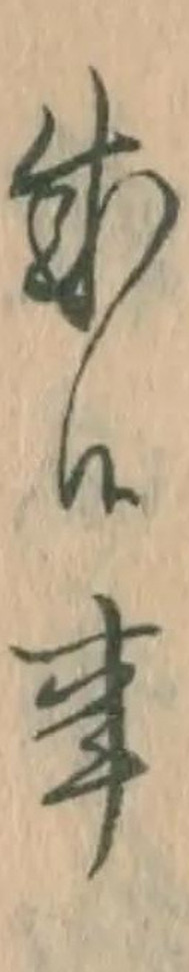成候事
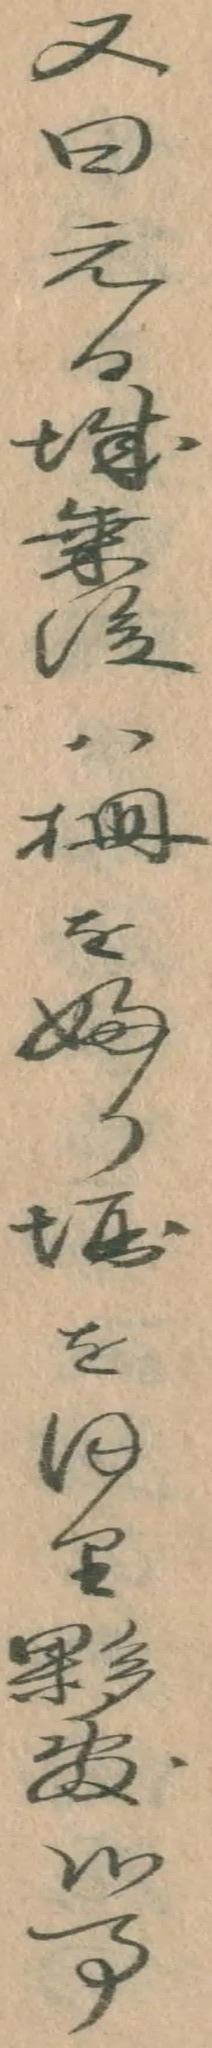又曰元日城乗後は柵を婦り堀を保里夥敷候事
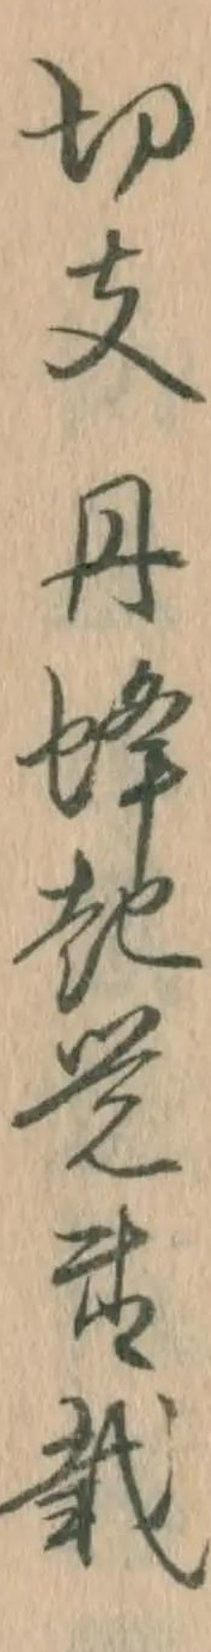切支丹蜂起覚書載
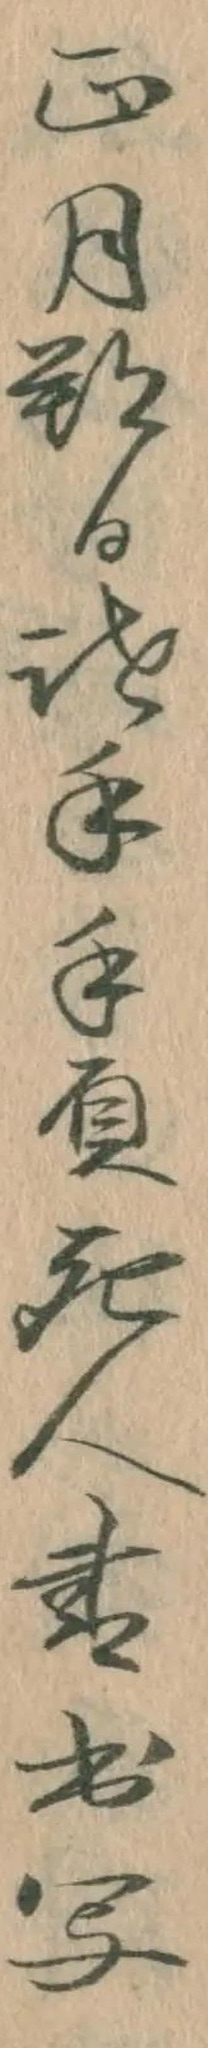正月朔日諸手手負死人書出写
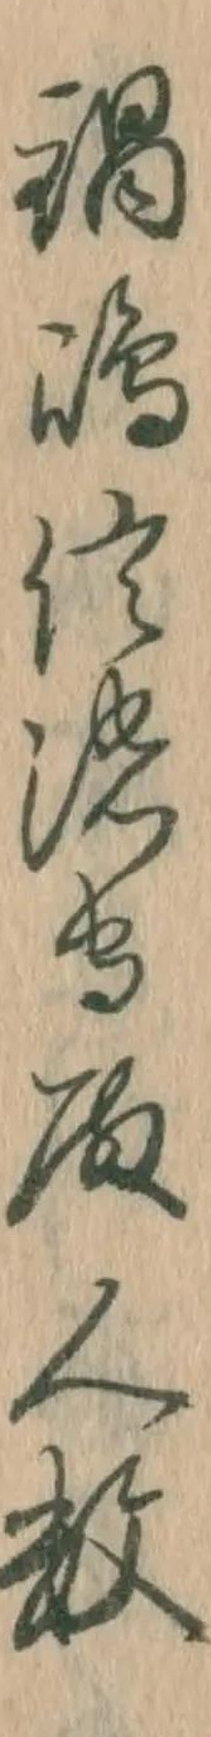鍋島信濃守殿人数
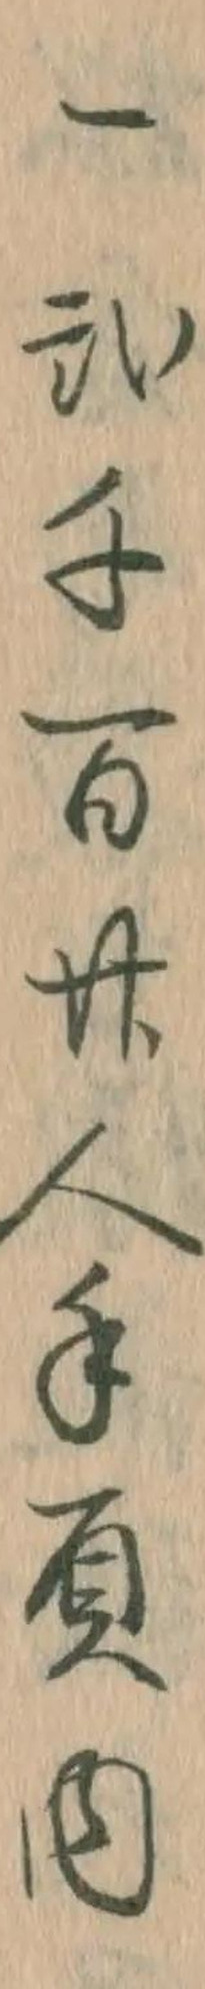一弐千百廿人手負内
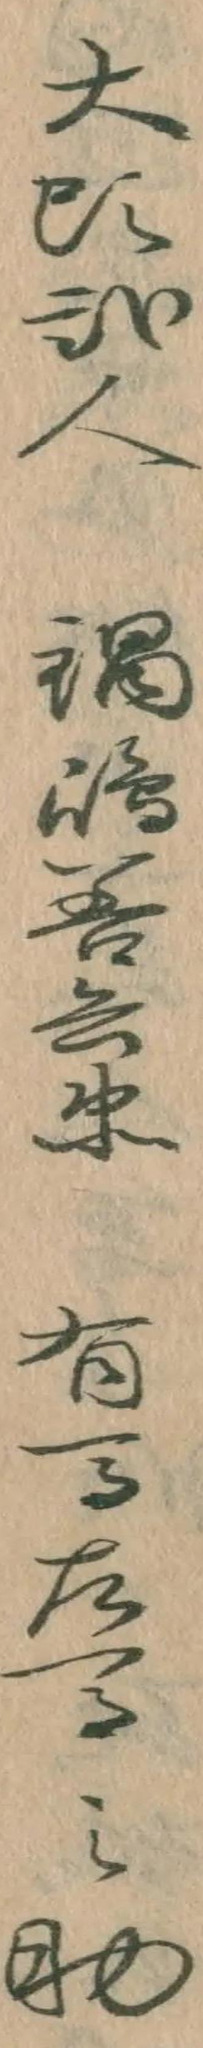大頭弐人鍋島善兵衛有馬左馬之助
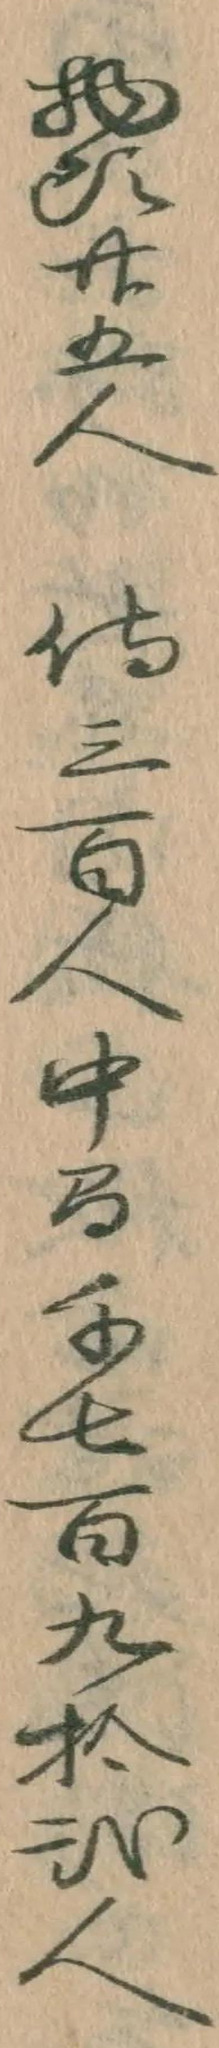物頭廿五人侍三百人中間千七百九拾弐人
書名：切支丹御退治記 49巻. [5]
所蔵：国立国会図書館 National Diet Library, JAPAN
